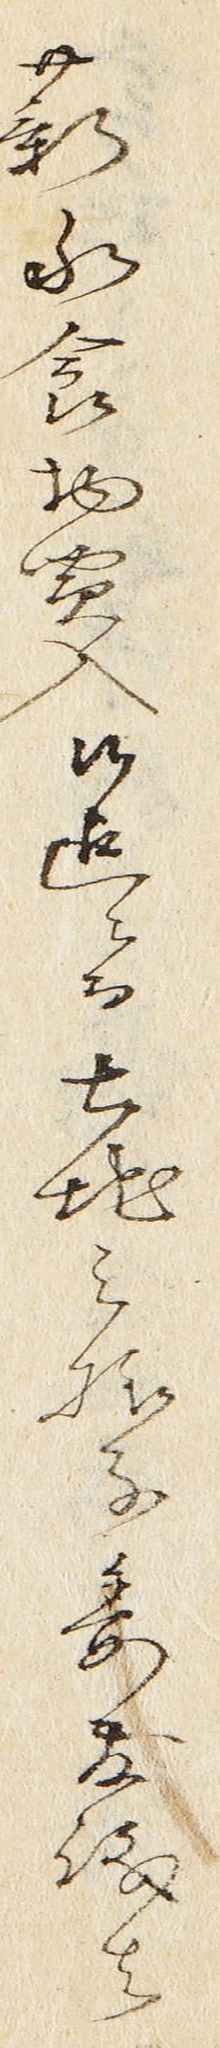薪水食物買入候迄に而土地之様子委敷儀は
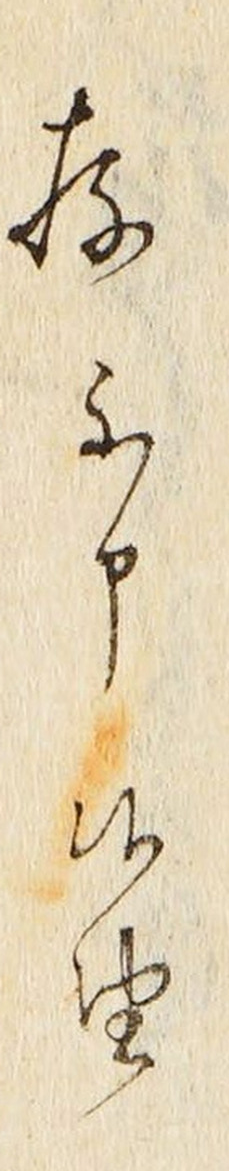存不申候由
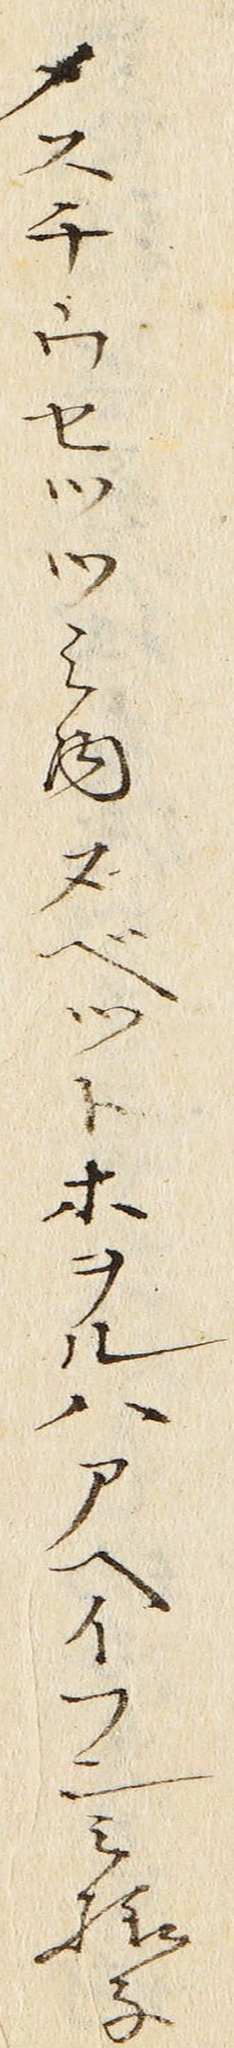メスチウセツツ之内ヌベツトホヲルハアヘイフン之様子
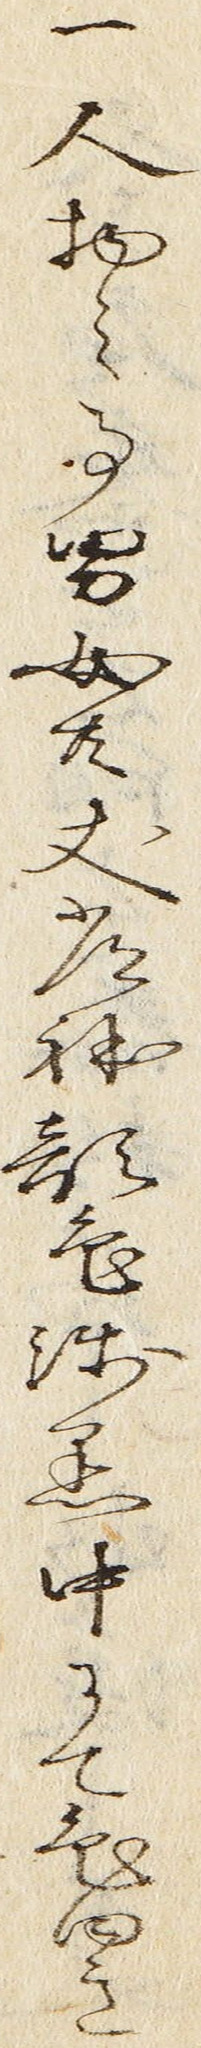一人物之事男女共丈常躰顔色浅黒中にて色白き
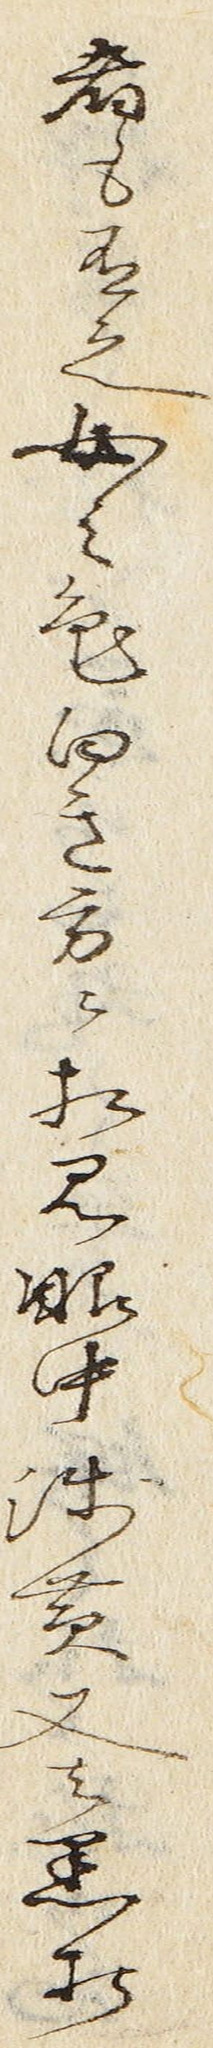者も有之女之色白き方に相見眼中浅黄又は黒打
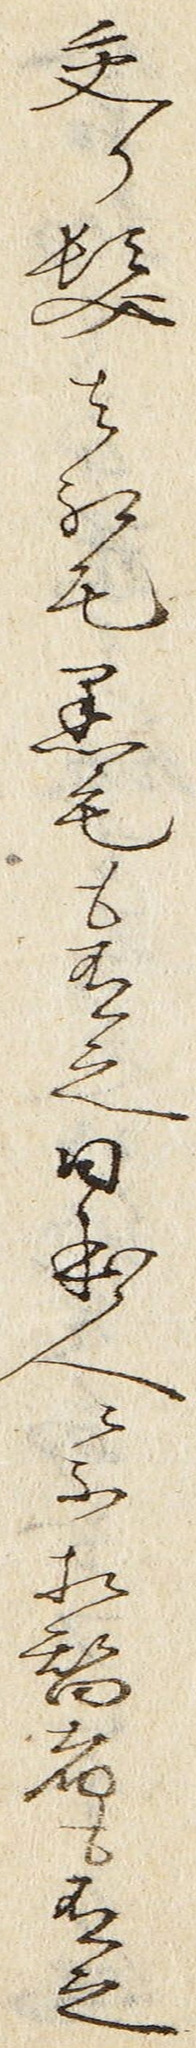交り髪は紅毛黒毛も有之日本人に不相替者も有之
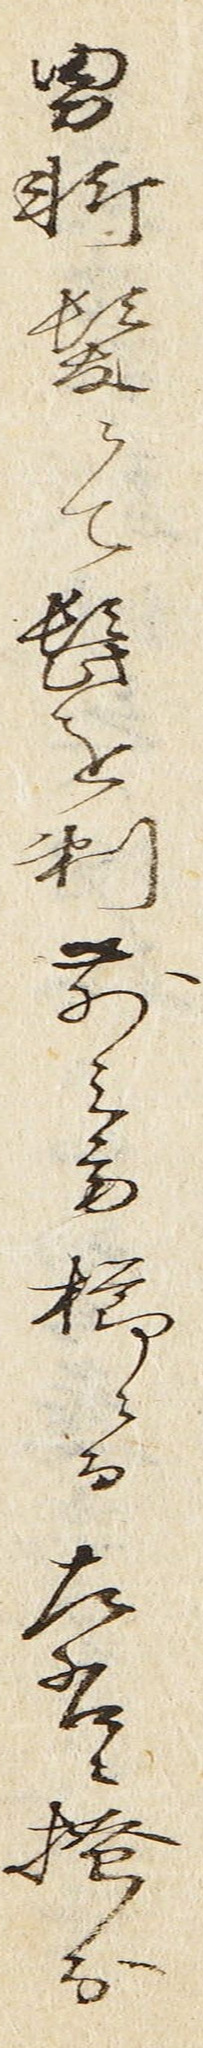男斬髪にて髭を剃前之方櫛に而左右に掻分
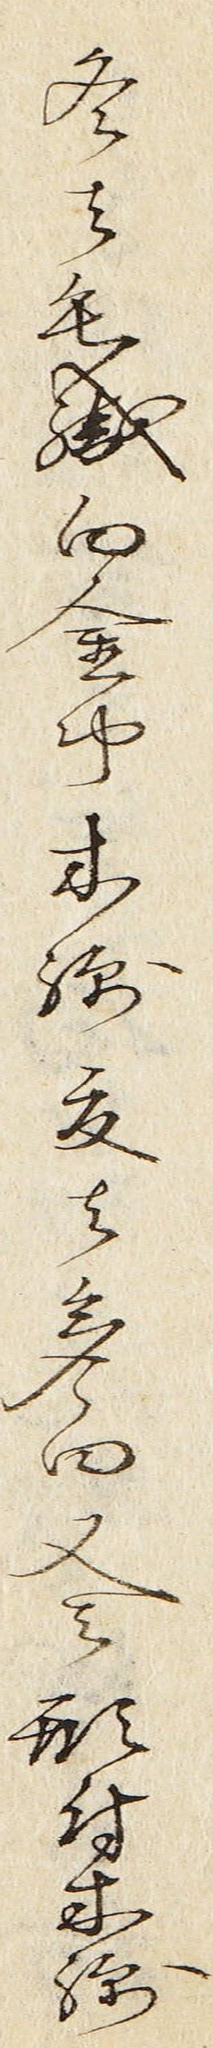冬は毛織白金巾木綿夏は多白又は形付木綿
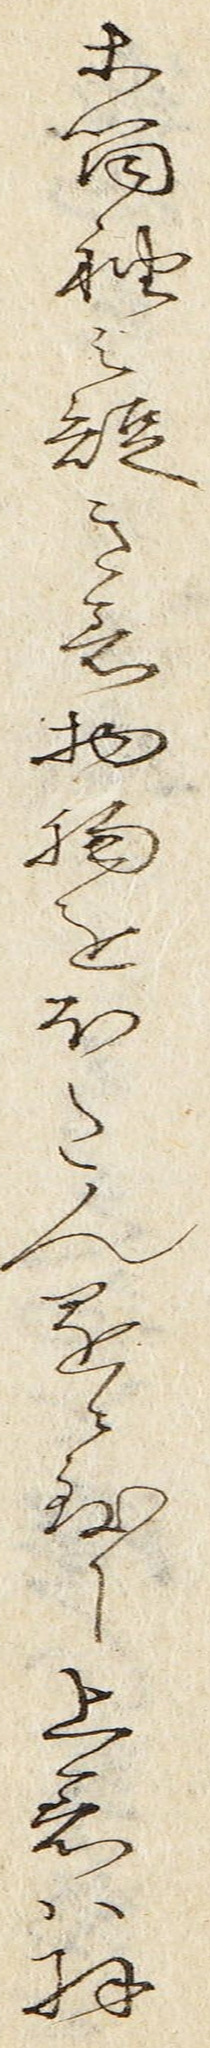等筒袖之短き着物胸をほたん懸にい致し上着は羽
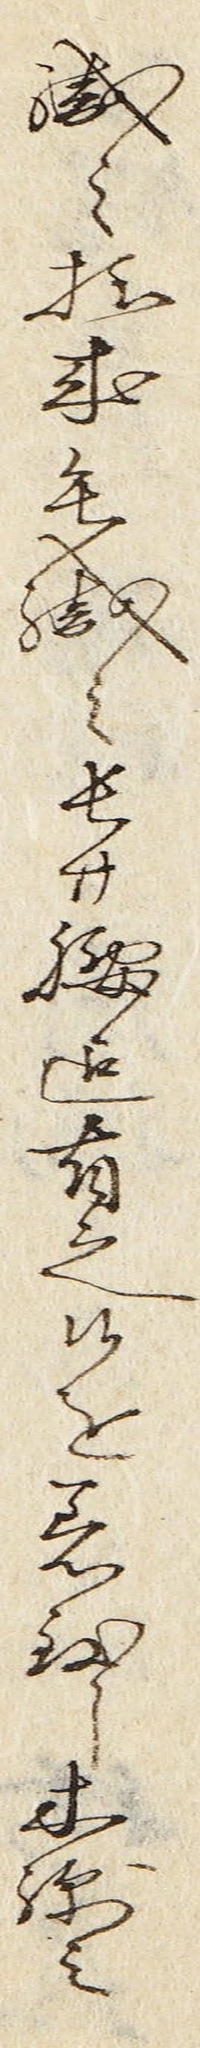織之様成毛織之長さ腰迄有之候を着致し木綿之
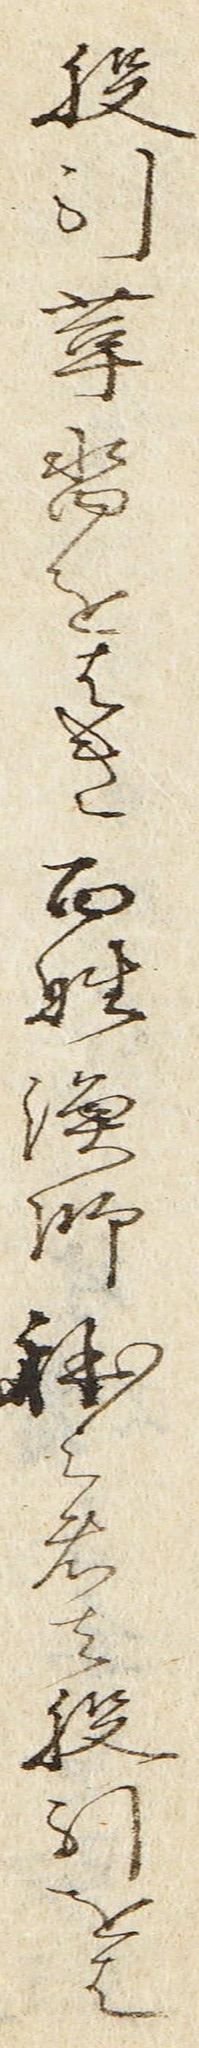股引革沓をはき百姓漁師躰之者は股引をは
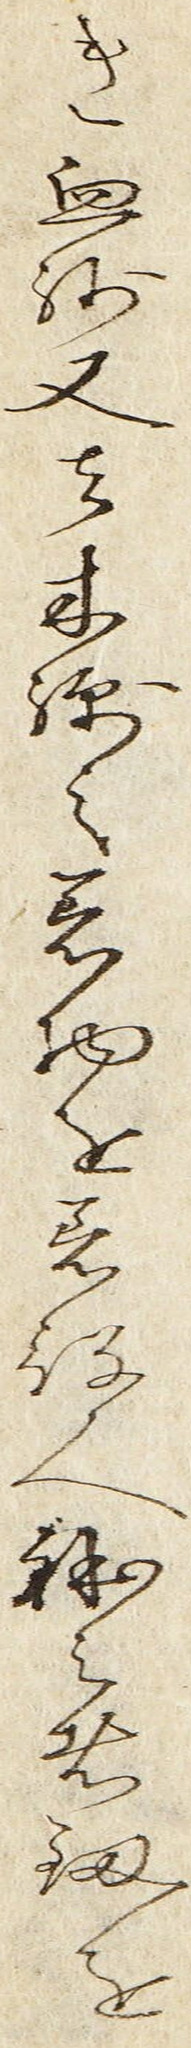き皿紗又は木綿之着物を着役人躰之者釼を
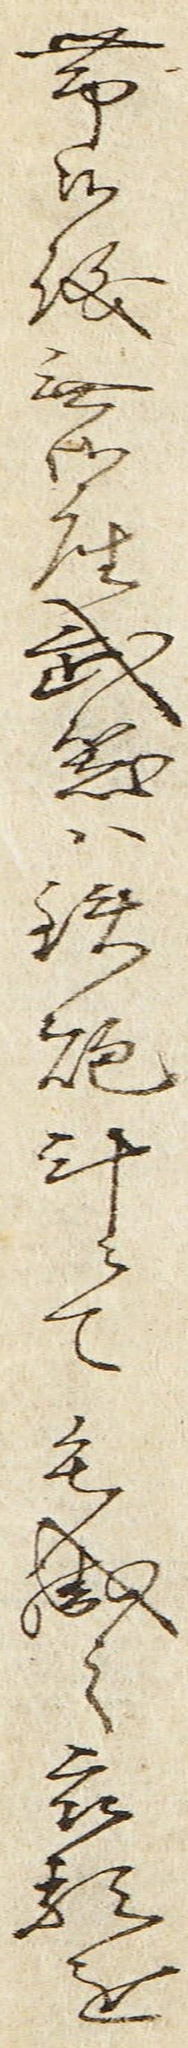帯候儀無御座武器は鉄砲計にて毛織之衣類を

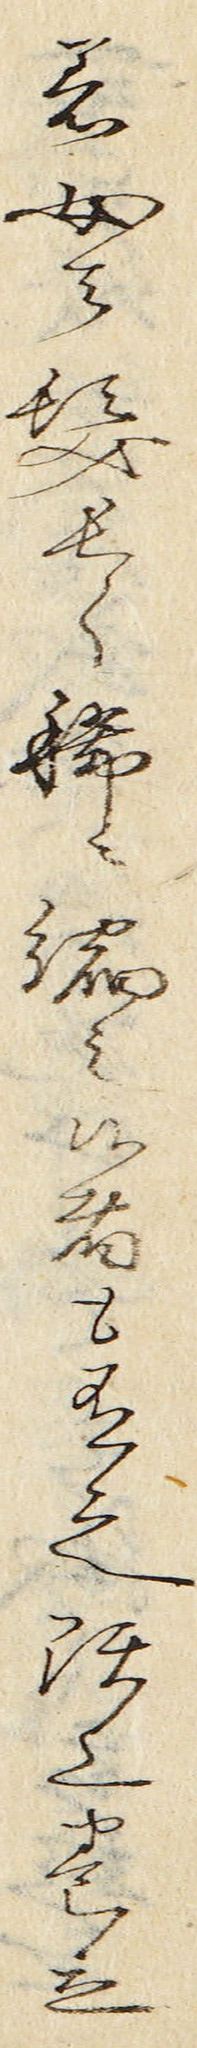着女は髪長く稀に縮み候者も有之頭上巻立
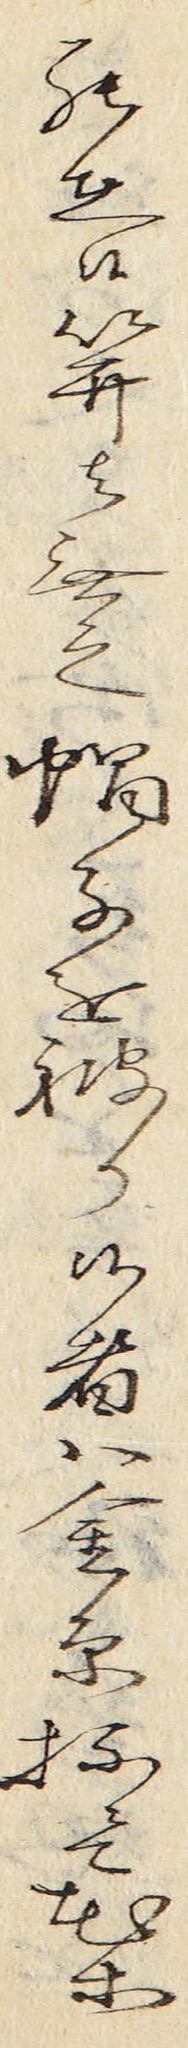罷在候笄は無之帽子を被り候者は金糸抔にて花等
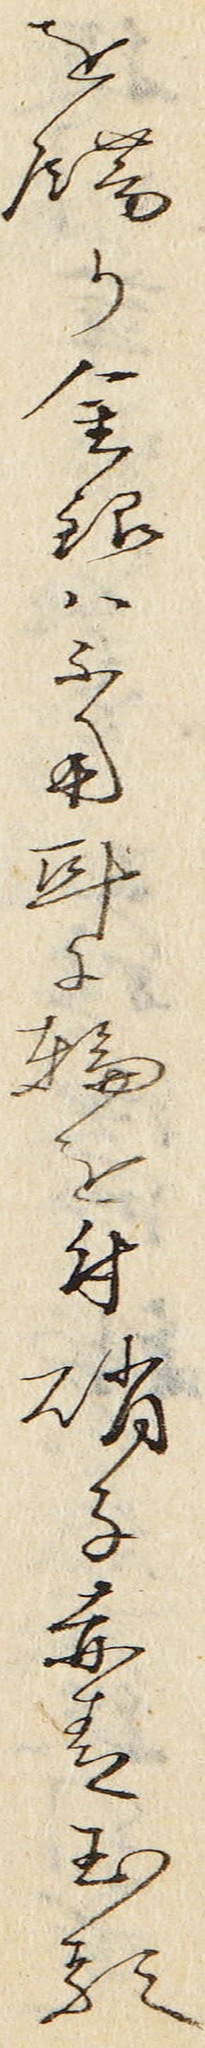を錺り金銀は不用耳に輪を付硝子赤青玉類
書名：土佐中浜万次郎漂流記
